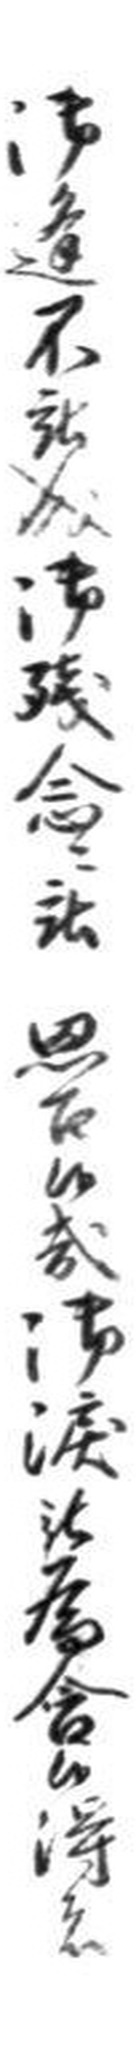御逢不被成御残念ニ被思召候哉御涙被為含候得者
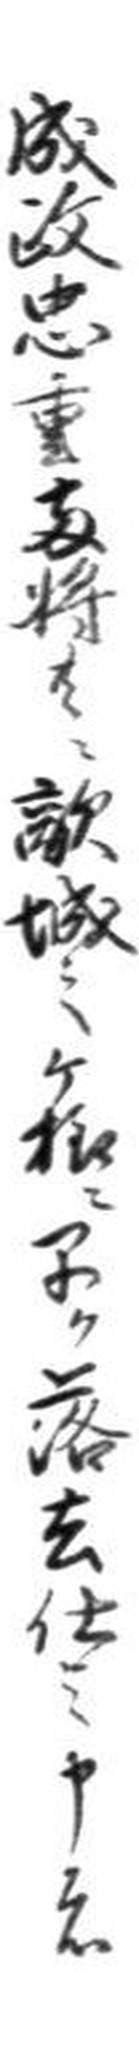成政忠重両将共ニ敵城之ケ様ニ早ク落去仕と申者
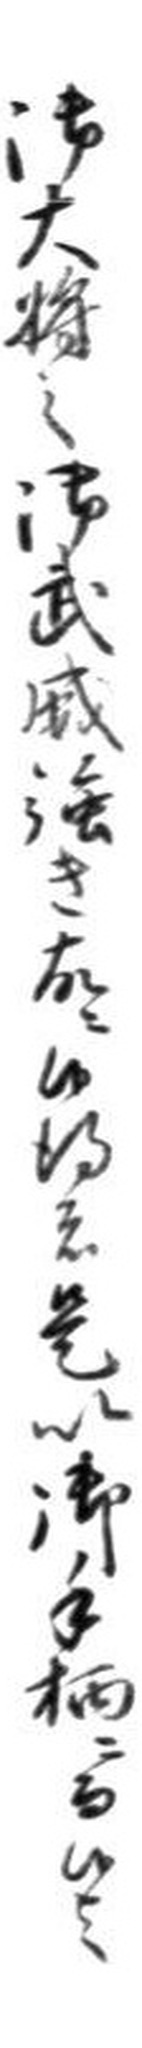御大将之御武威強き故ニ候得者是以御手柄ニ而候と
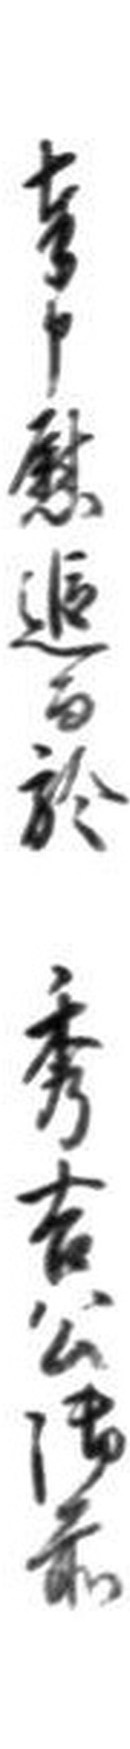奉申慰追而於秀吉公御前
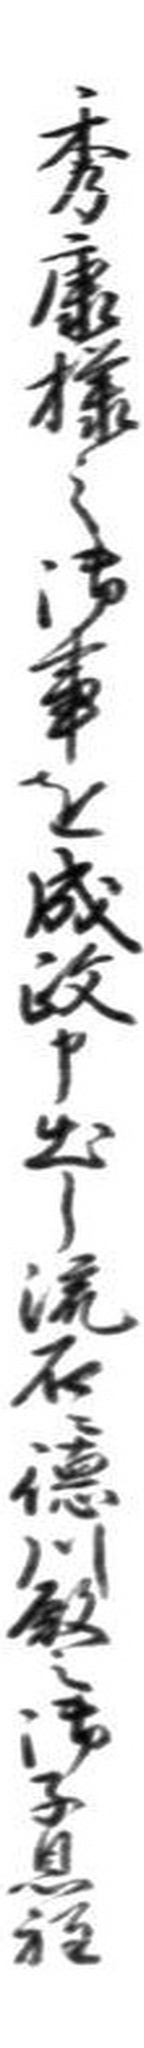秀康様之御事を成政申出し流石ニ徳川殿之御子息程
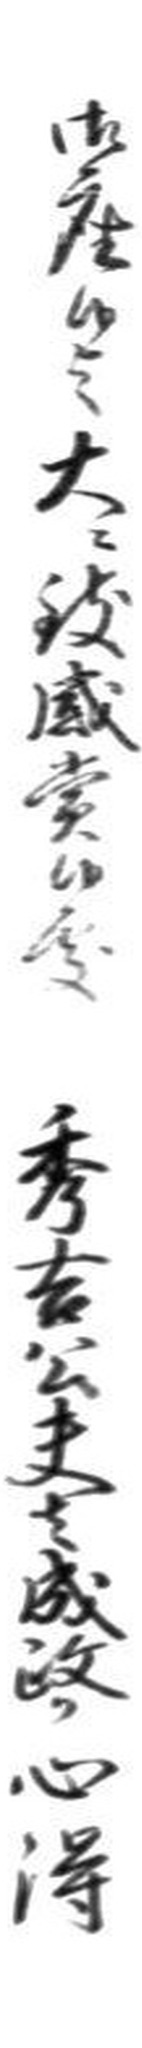御座候と大ニ致感賞候処秀吉公夫者成政か心得
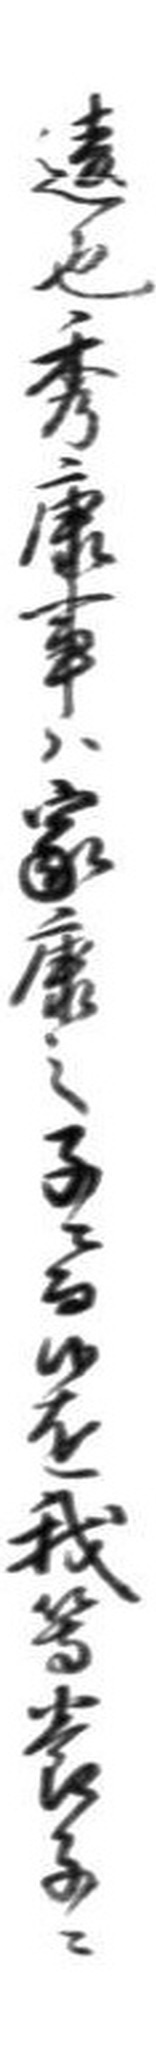違也秀康事ハ家康之子ニ而候を我等養子ニ
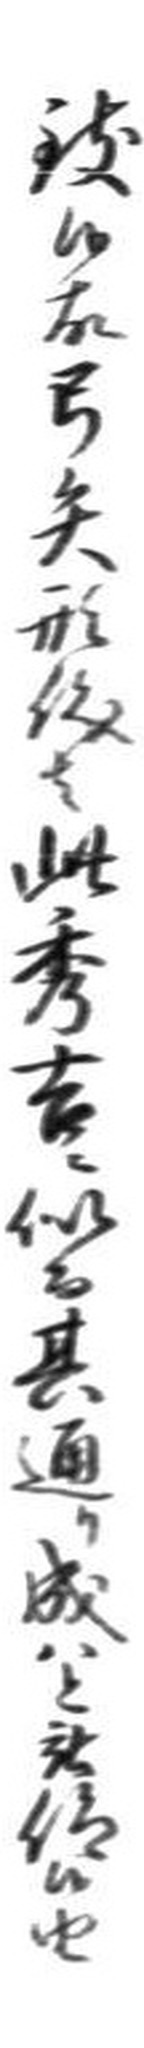致候故弓矢形儀者此秀吉ニ似而其通り成ハと被仰候由
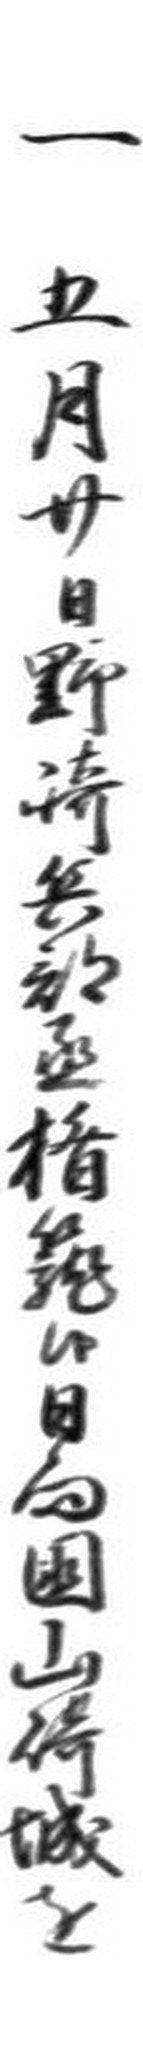一五月廿日野崎兵部丞楯籠候日向国山崎城を
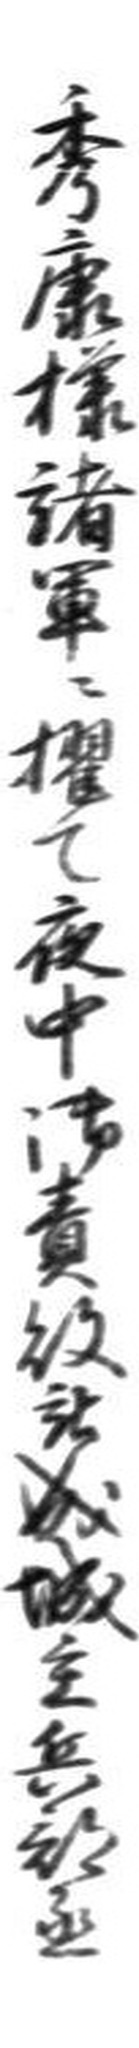秀康様諸軍ニ擢て夜中御責役被成城主兵部丞
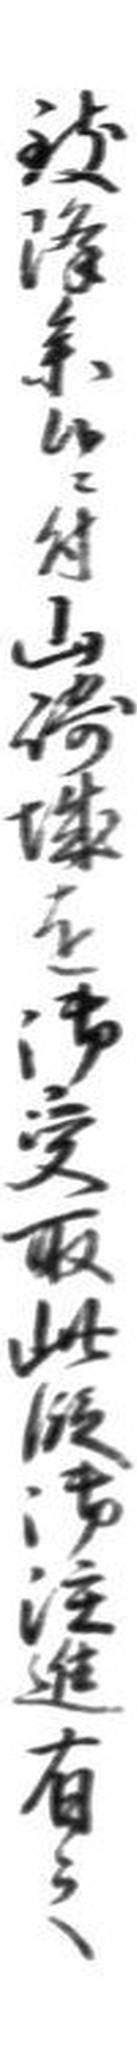致降参候ニ付山崎城を御受取此段御注進有之
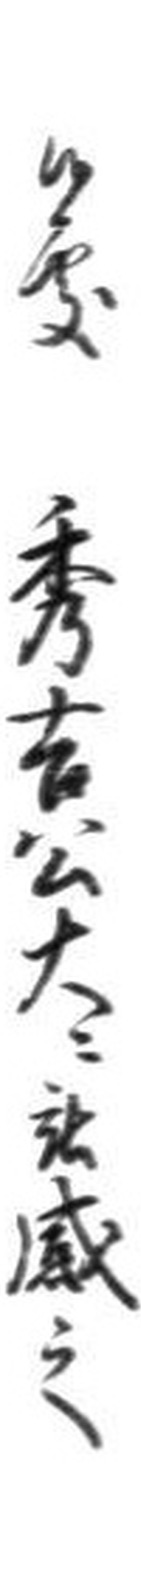候処秀吉公大ニ被感之
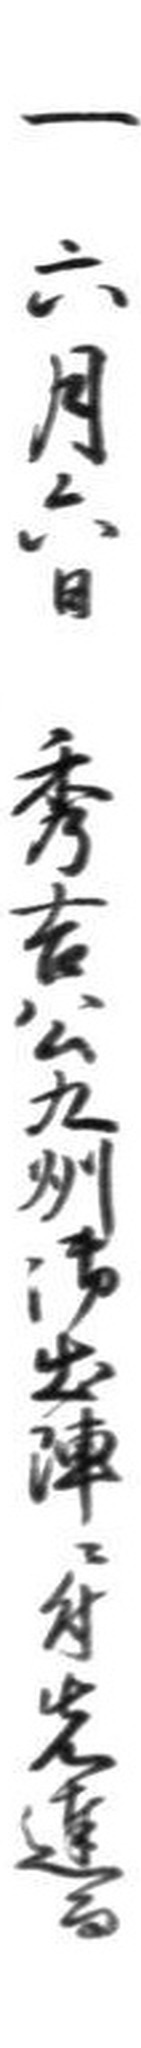一六月六日秀吉公九州御出陣ニ付先達而

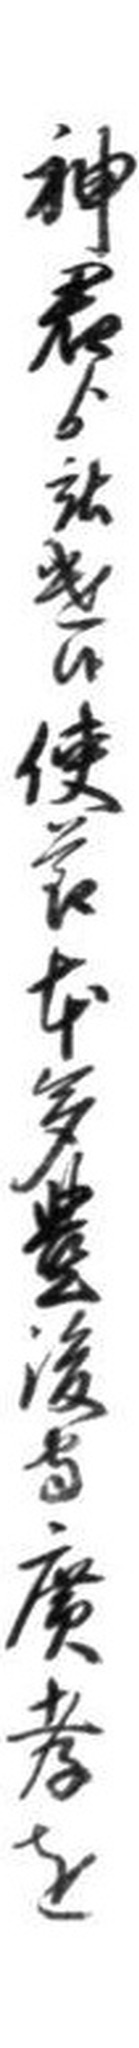神君ゟ被遣候使節本多豊後守広孝を
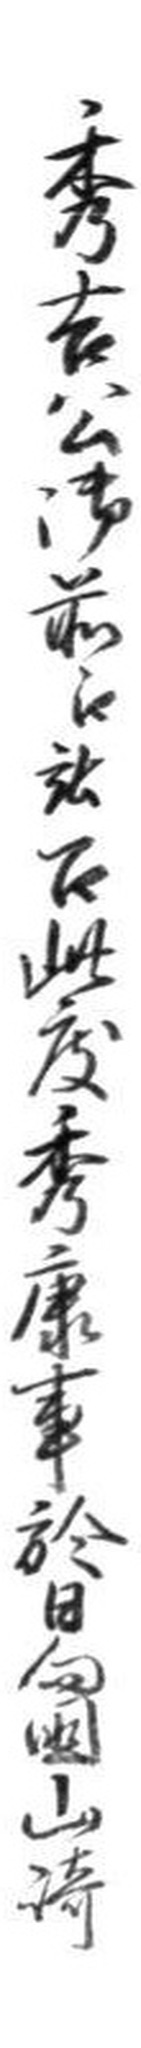秀吉公御前江被召此度秀康事於日向国山崎
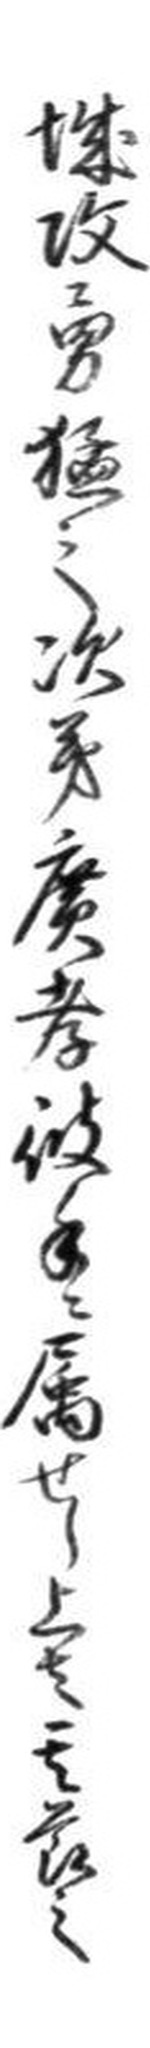城攻勇猛之次第広孝彼手に属せし上は其節之
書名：家譜 一 秀康公 従天正二年到慶長十二年
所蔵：福井県文書館 Fukui Prefectural Archives
